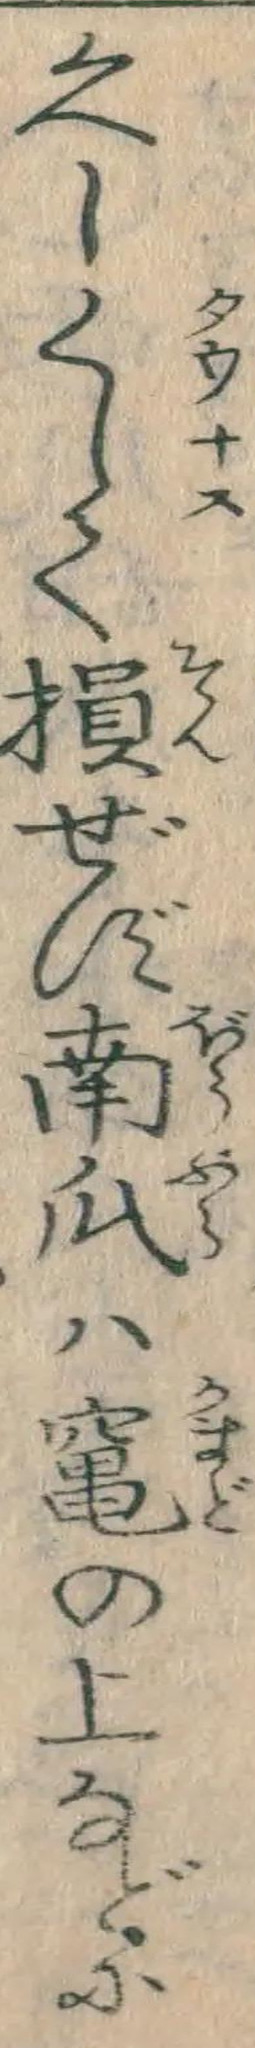久しくして損ぜず南瓜は竈の上などに
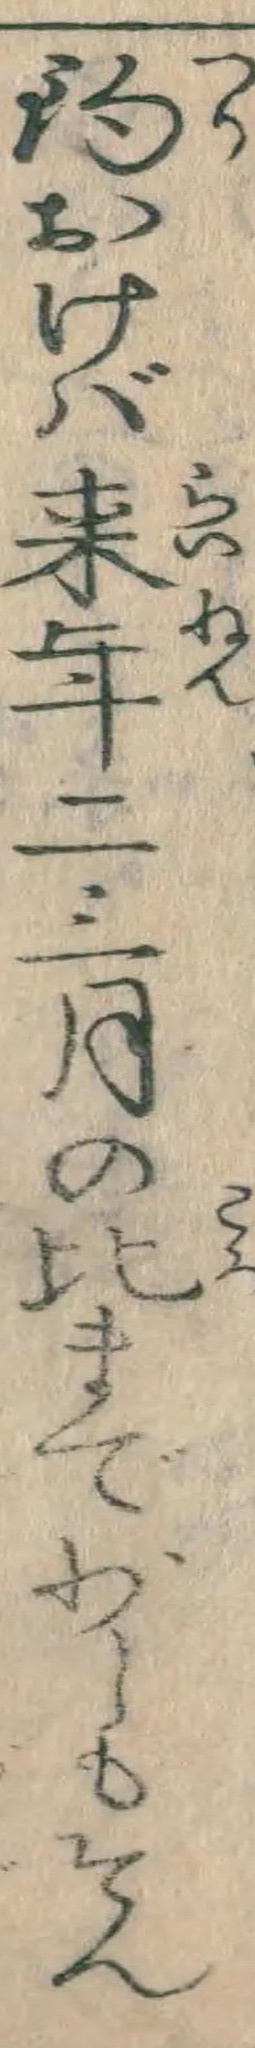釣おけば来年二三月の比まで少しもそん
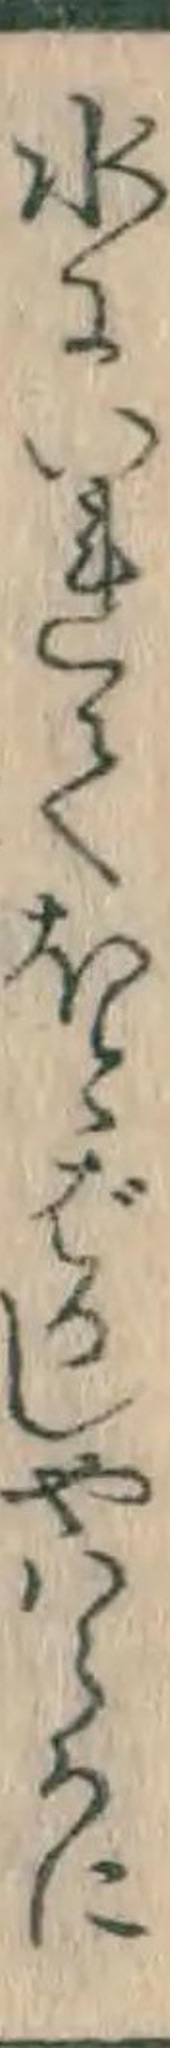水にいれてほとばかしやはらかに
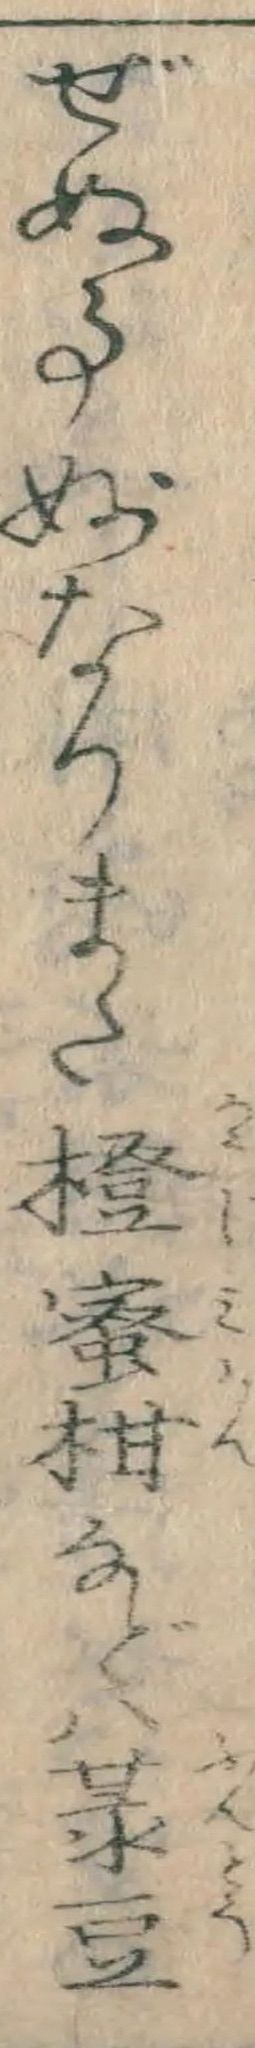ぜぬ事妙なりまた橙蜜柑などは菉豆
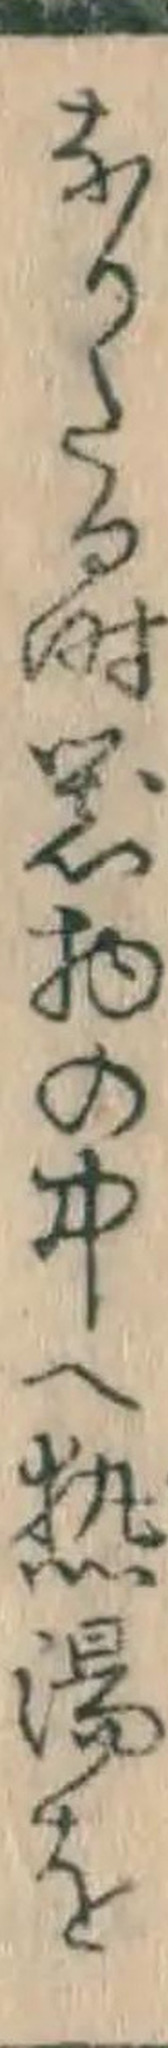なりたる時器物の中へ熱湯を
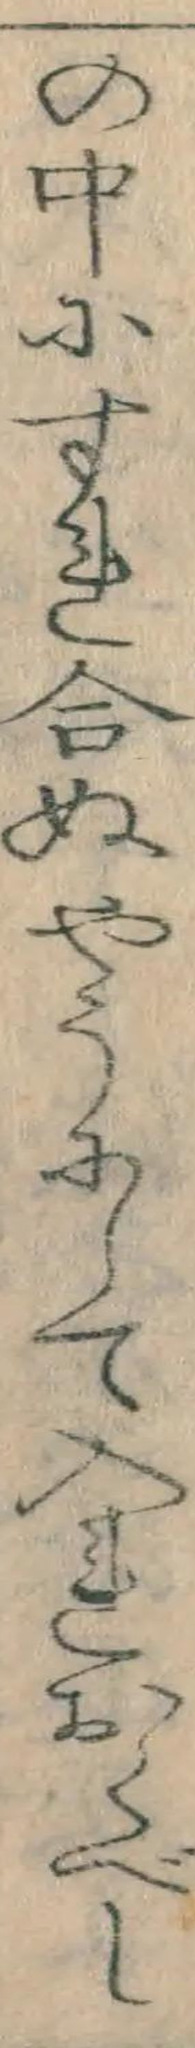の中にすれ合ぬやうにして入れおくべし

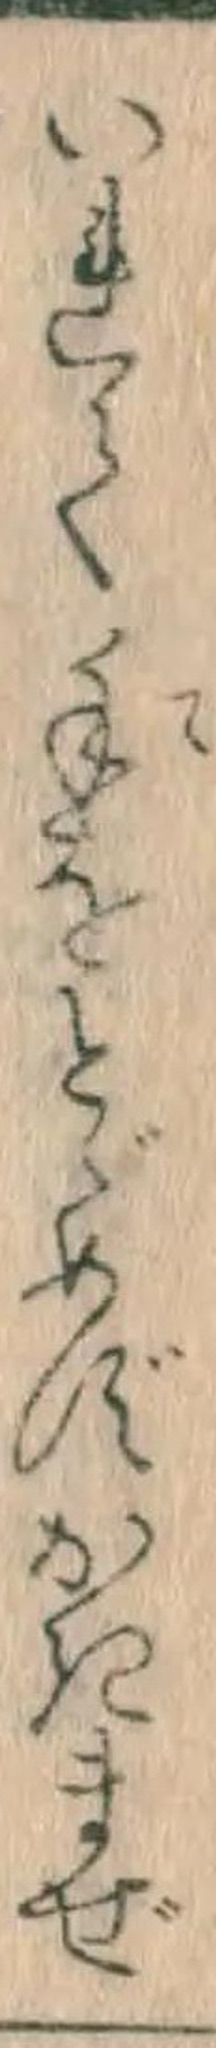いれて手をとゞめずかきまぜ
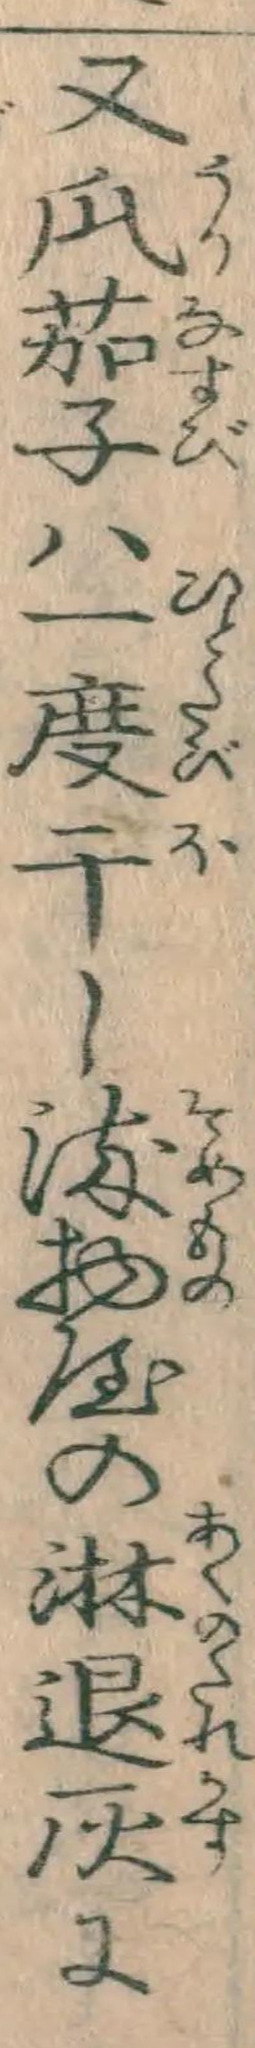又瓜茄子は一度干し染物屋の淋退灰に
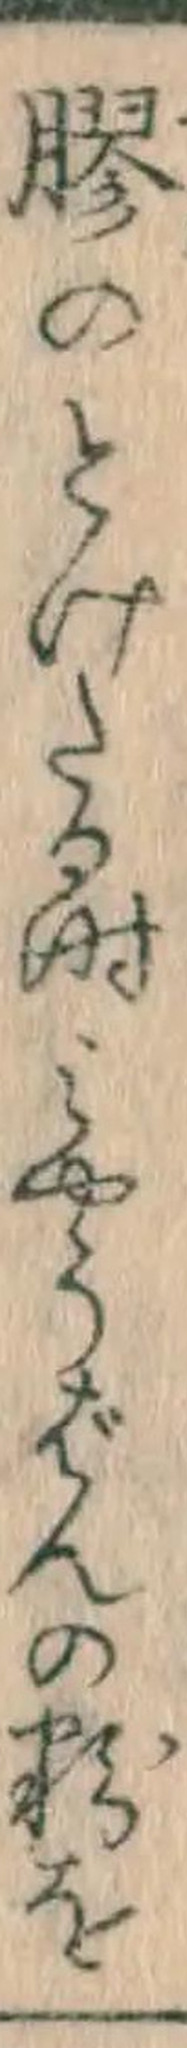膠のとけたる時みやうばんの粉を
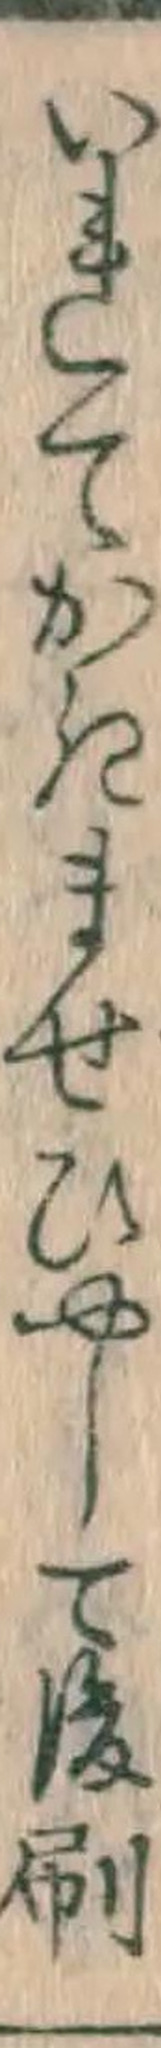いれてかきまぜひやして後刷
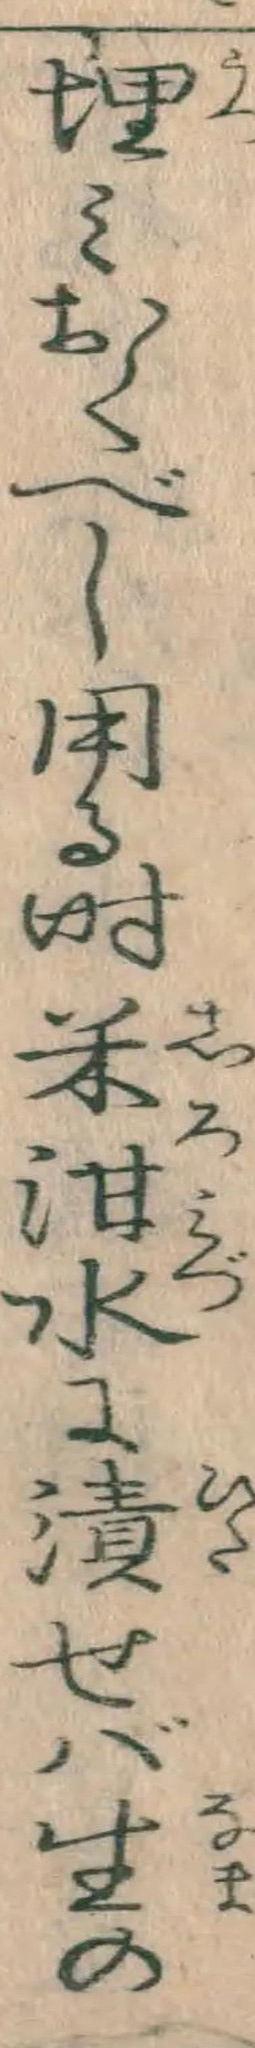埋みおくべし用る時米泔水に漬せば生の
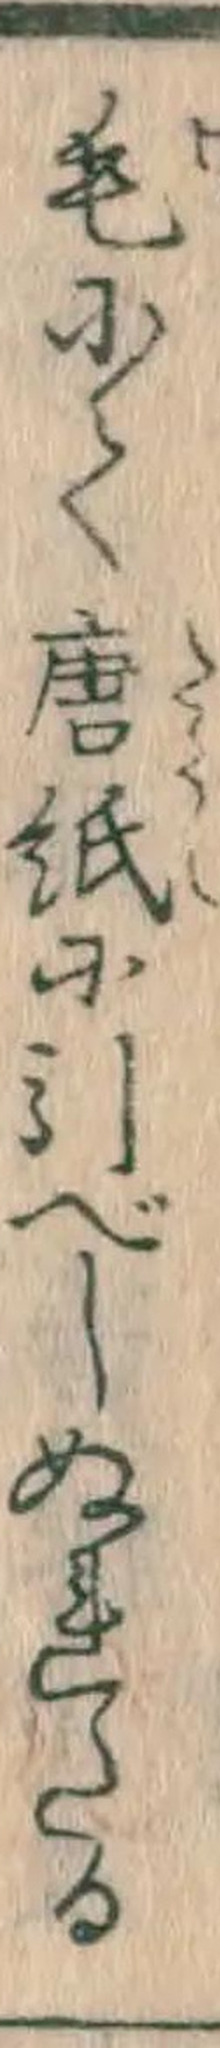毛にて唐紙に引べしぬれたる
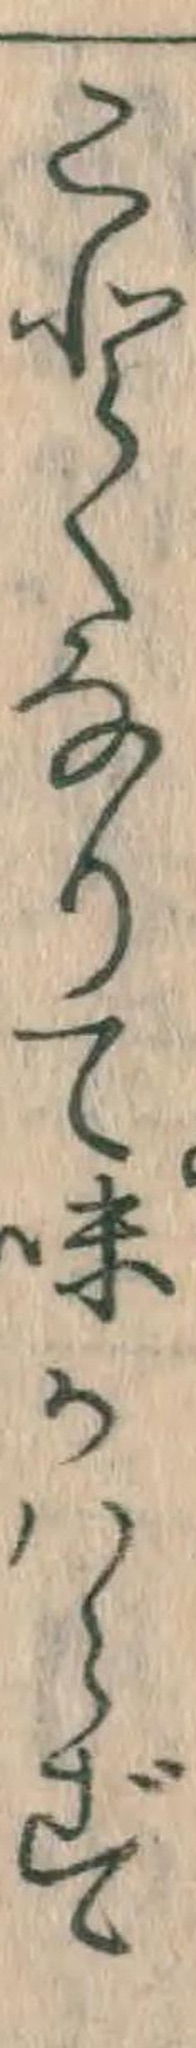ことくなりて味かはらず
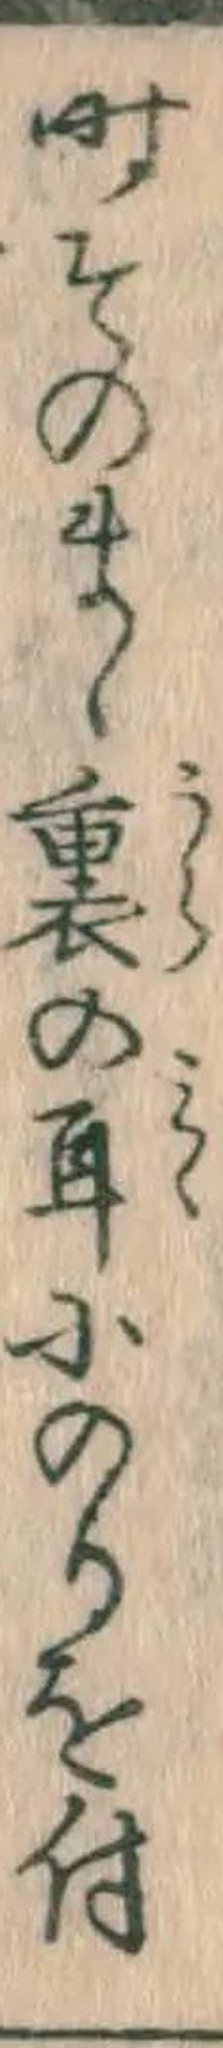時そのまゝ裏の耳にのりを付
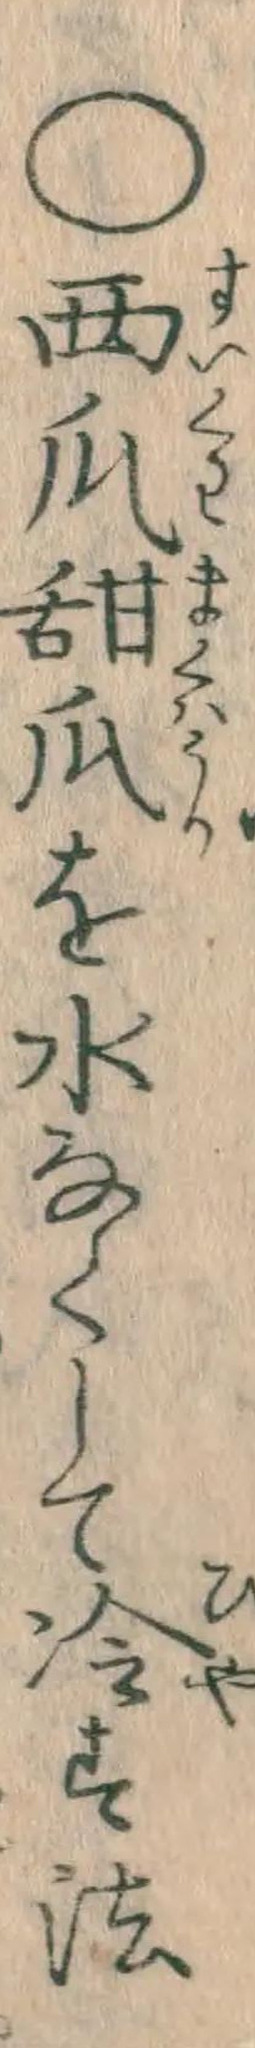○西瓜甜瓜を水なくして冷す法
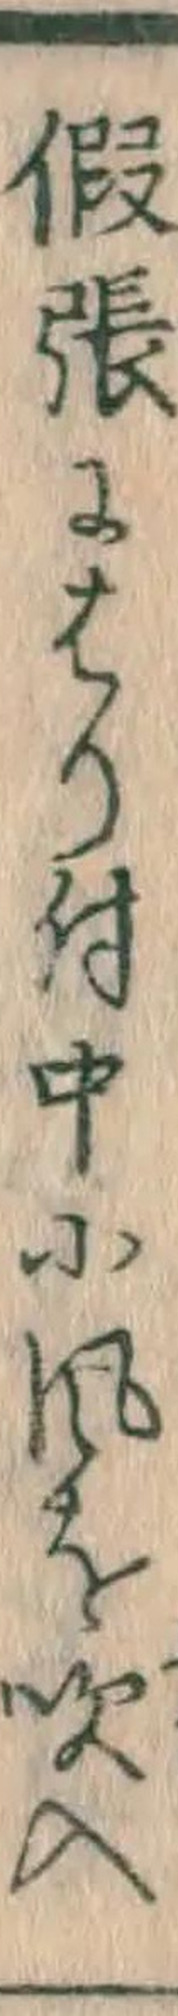假張にはり付中に風を吹入
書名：広益秘事大全 3巻. [2]
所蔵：国立国会図書館 National Diet Library, JAPAN
